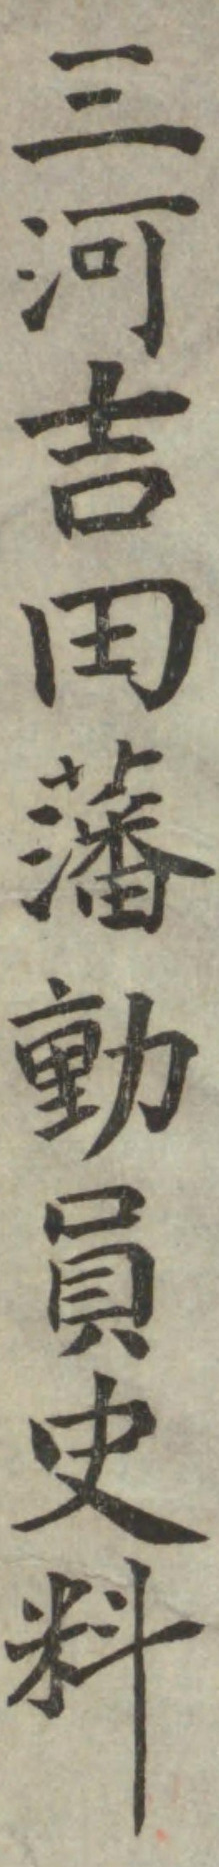三河吉田藩動員史料

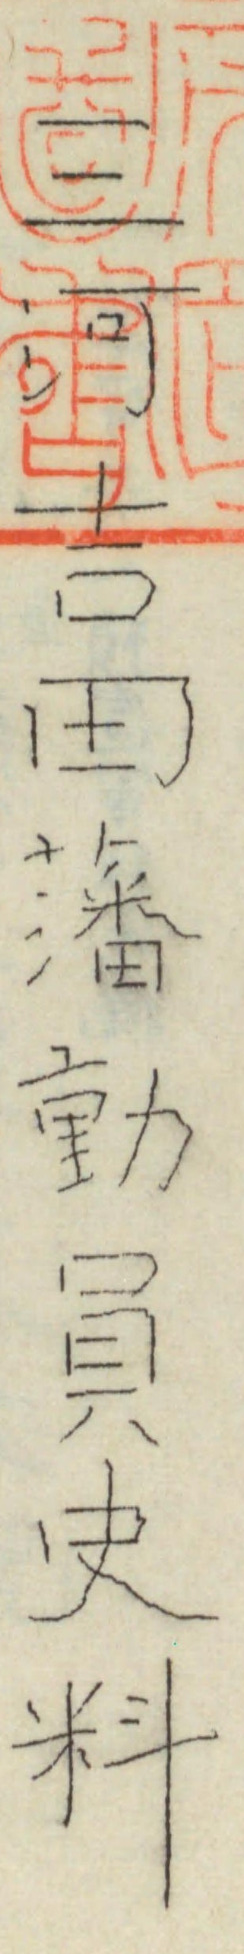三河吉田藩動員史料

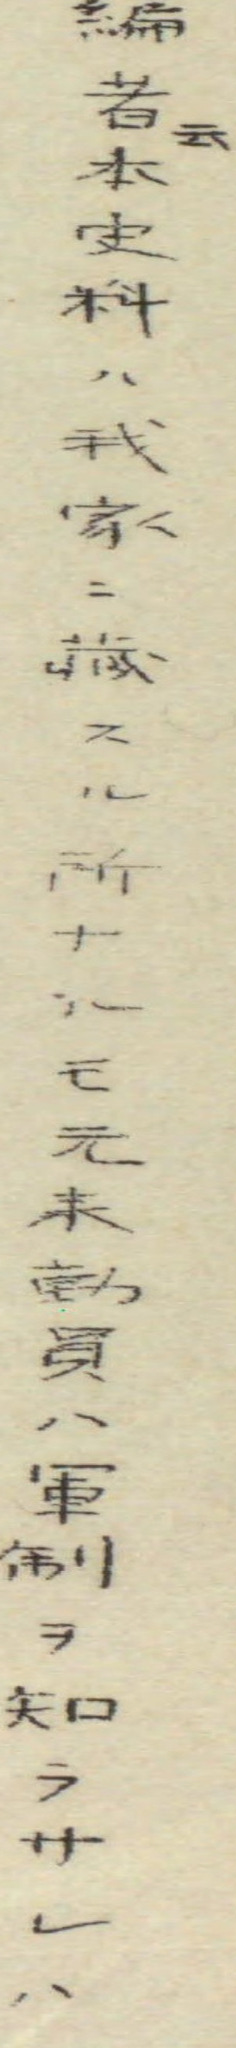編者云本史料ハ我家ニ蔵スル所ナルモ元来動員ハ軍制ヲ知ラサレハ
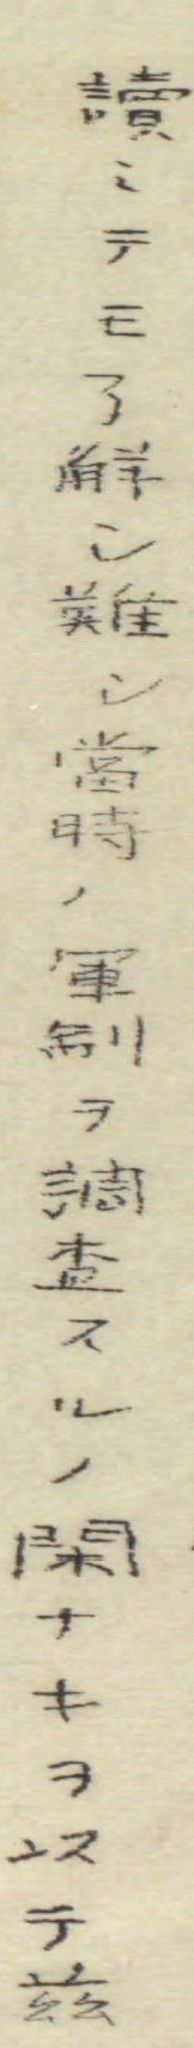読ミテモ了解シ難シ当時ノ軍制ヲ調査スルノ閑ナキヲ以テ茲
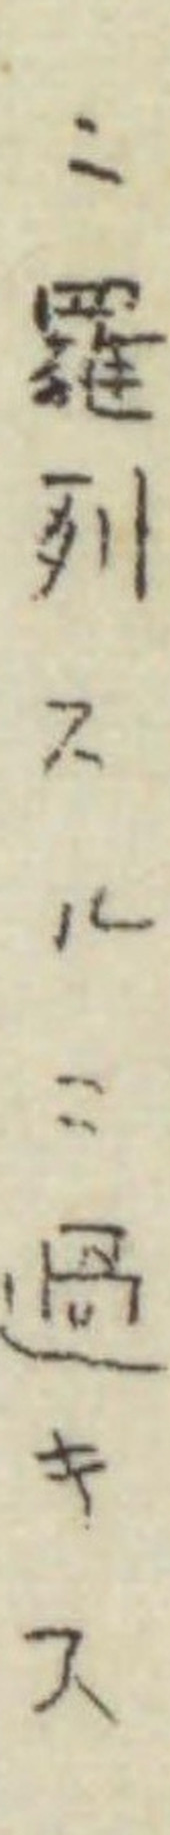ニ羅列スルニ過キス
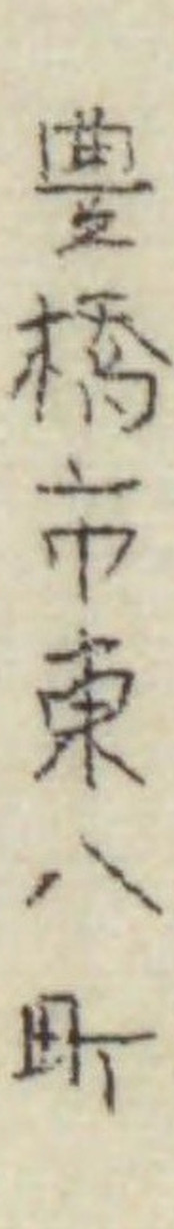豊橋市東八町
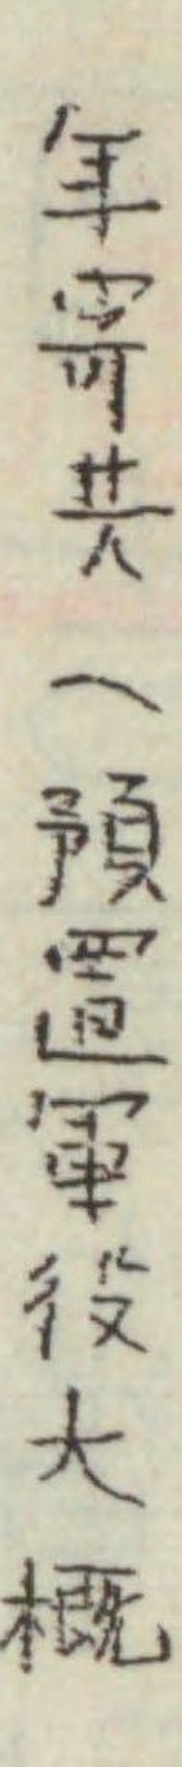年寄共え預置軍役大概
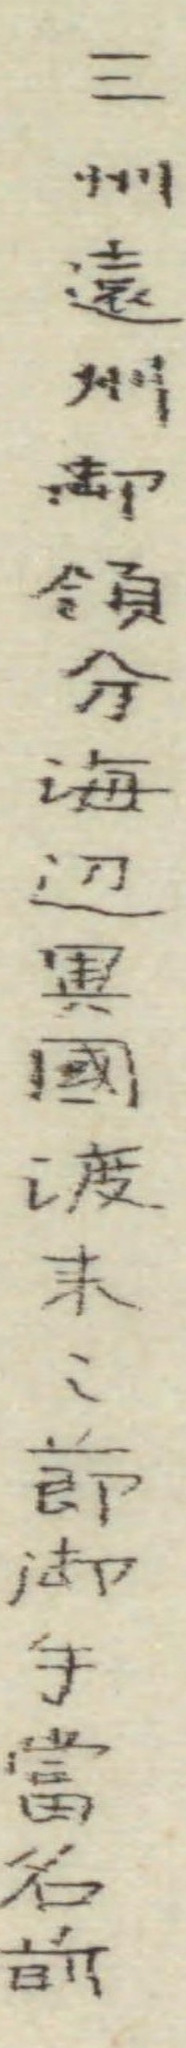三州遠州御領分海辺異国渡来之節御手当名前二十七
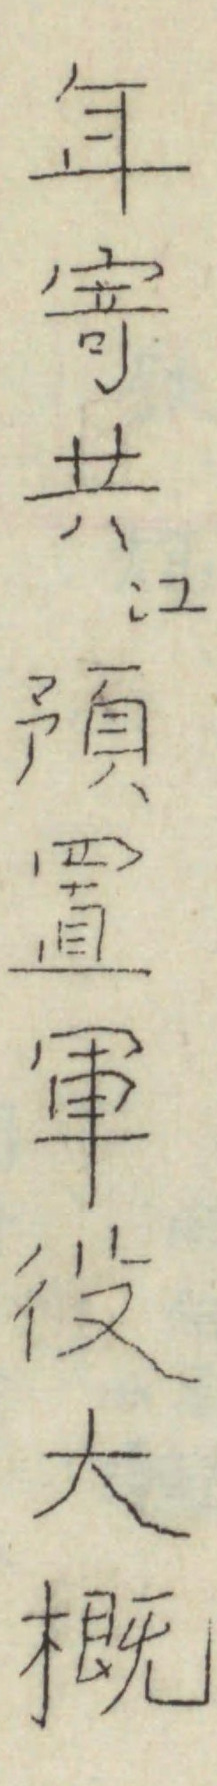年寄共え預置軍役大概

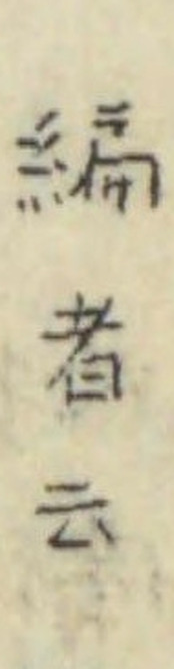編者云
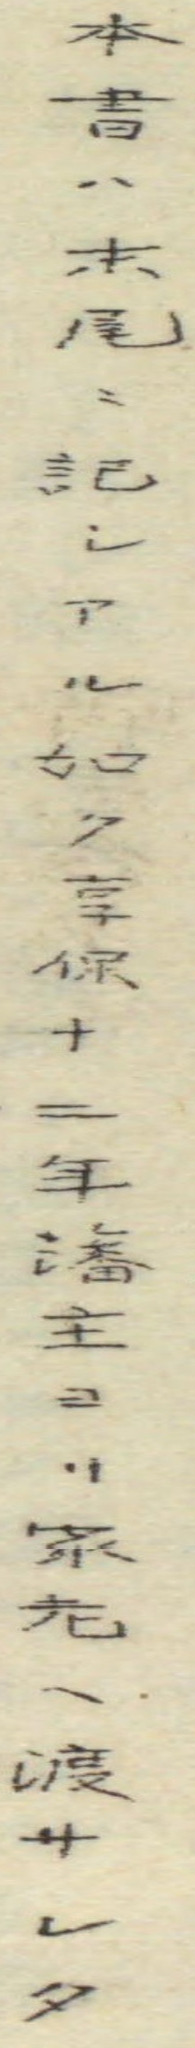本書ハ末尾ニ記シアル如ク享保十二年藩主ヨリ家老ヘ渡サレタ
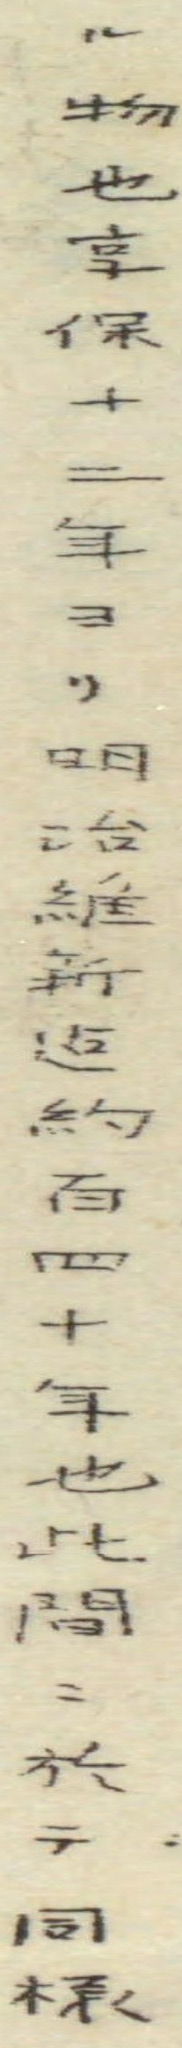ル物也享保十二年ヨリ明治維新迄約百四十年也此間ニ於テ同様
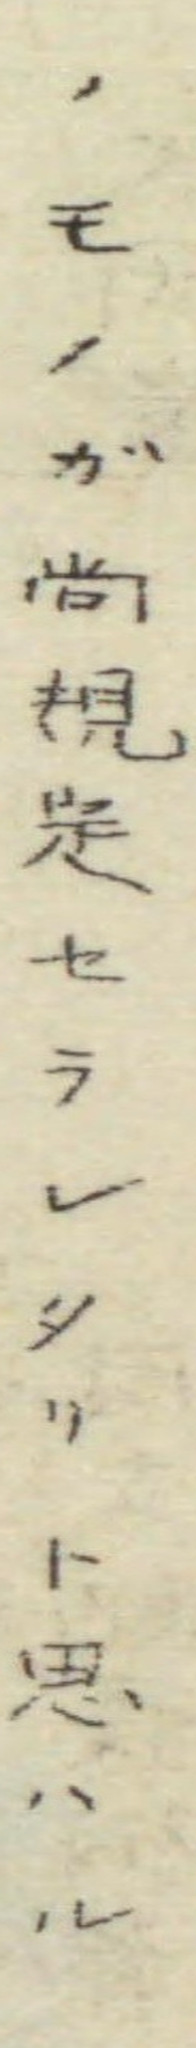ノモノガ尚規定せラレタリト思ハル
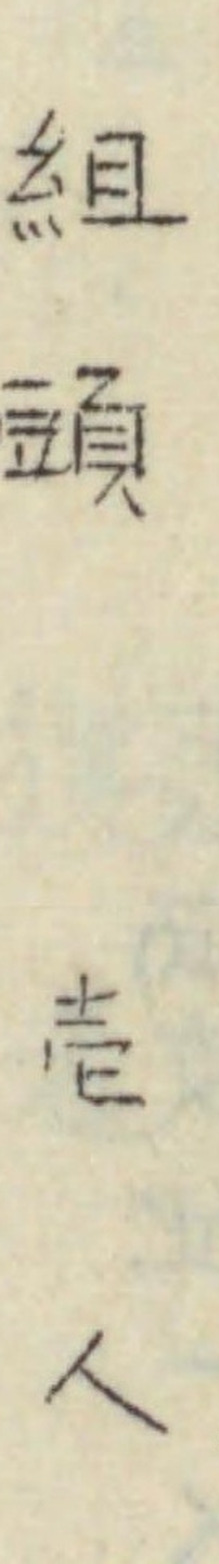組頭壱人
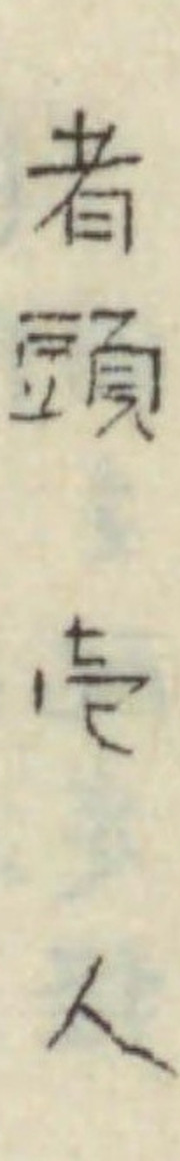備頭壱人
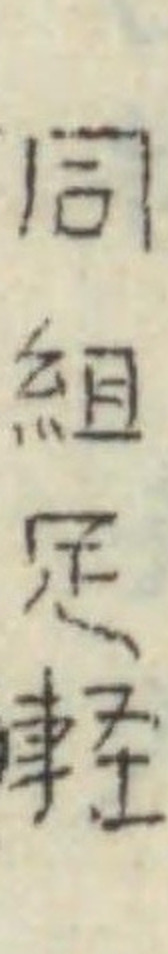同組足軽
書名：三河吉田藩動員史料
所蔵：国立国会図書館 National Diet Library, JAPAN
